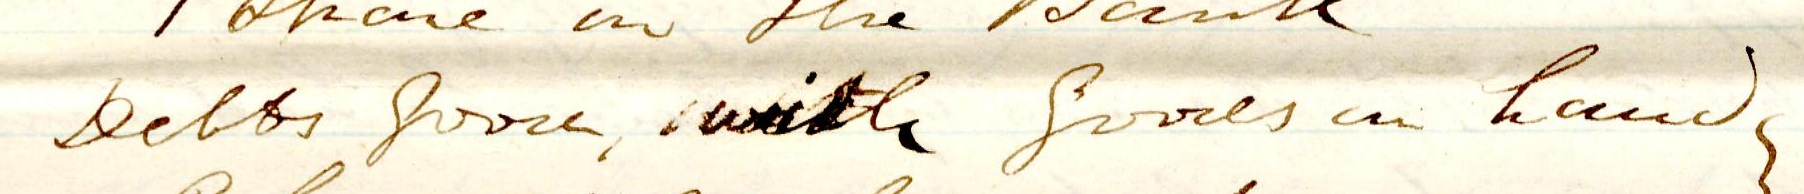Debts good with goods in hand
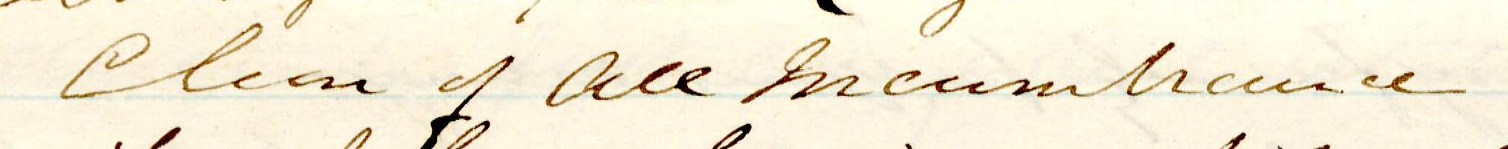Clean of all Incumbrance
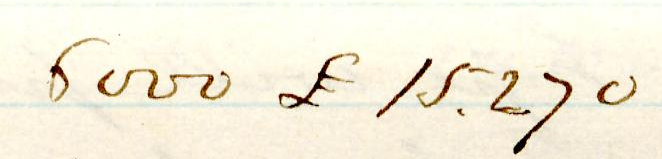6000 £15.270
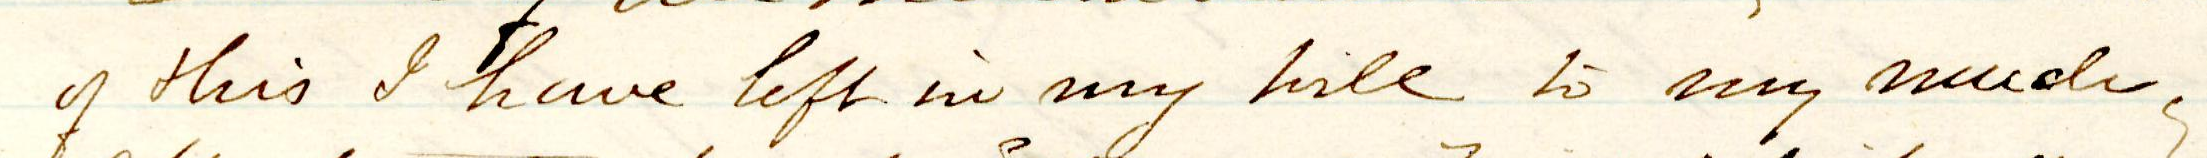of this I have left in my bill to my uncle
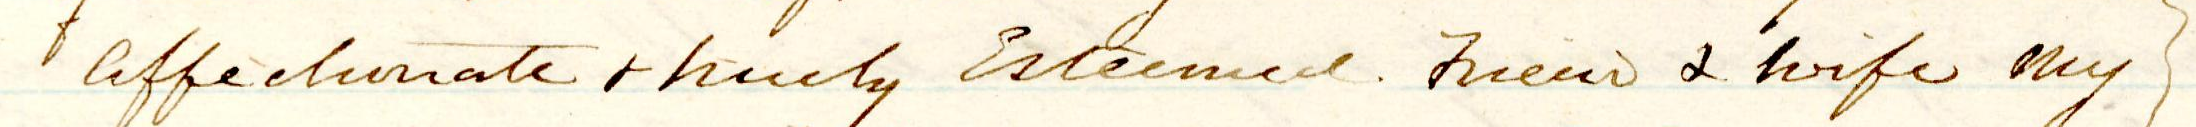Affectionate & nicely Esteemed Friend & wife my
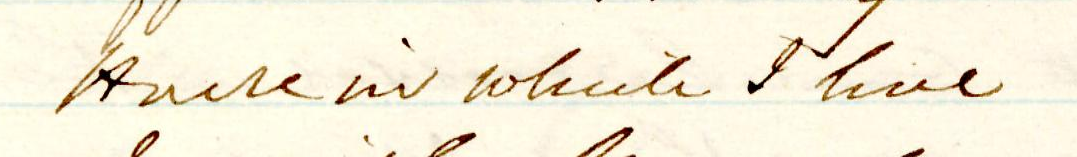Accte in which I have
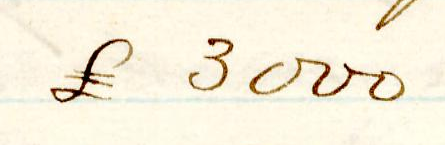£3000
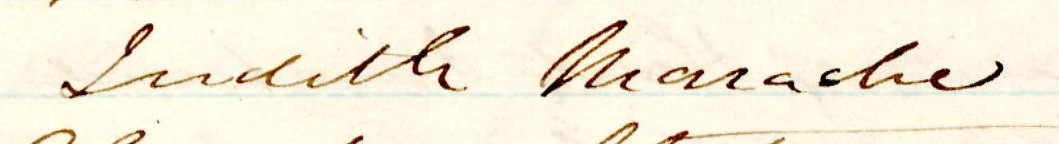Judith Marashe
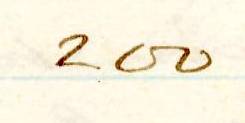200
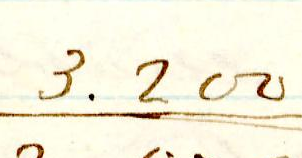3.200
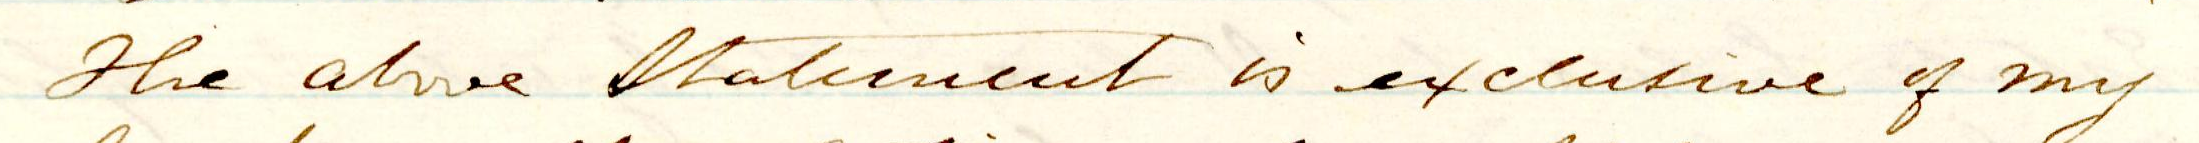The above statement is exclusive of my
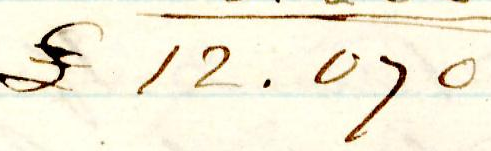£12.070
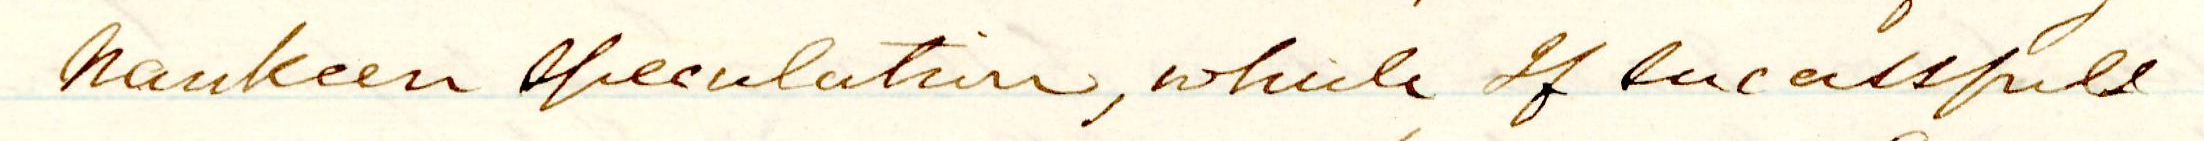Naukeen speculation, which If sucessfull
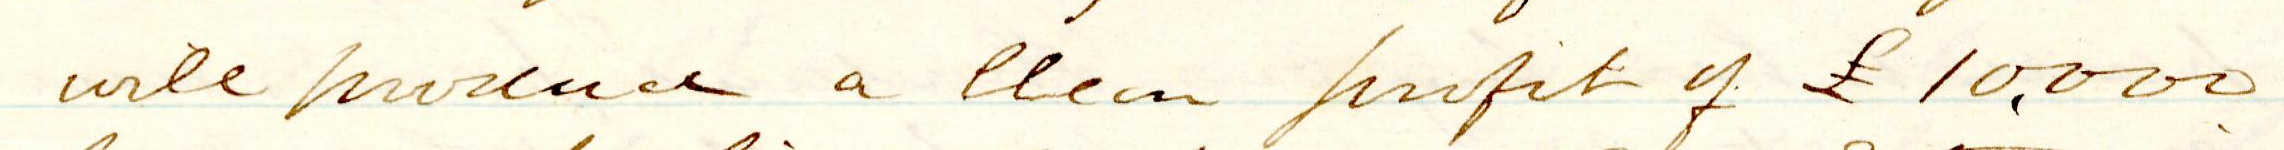will present a Clean profit of £10,000
